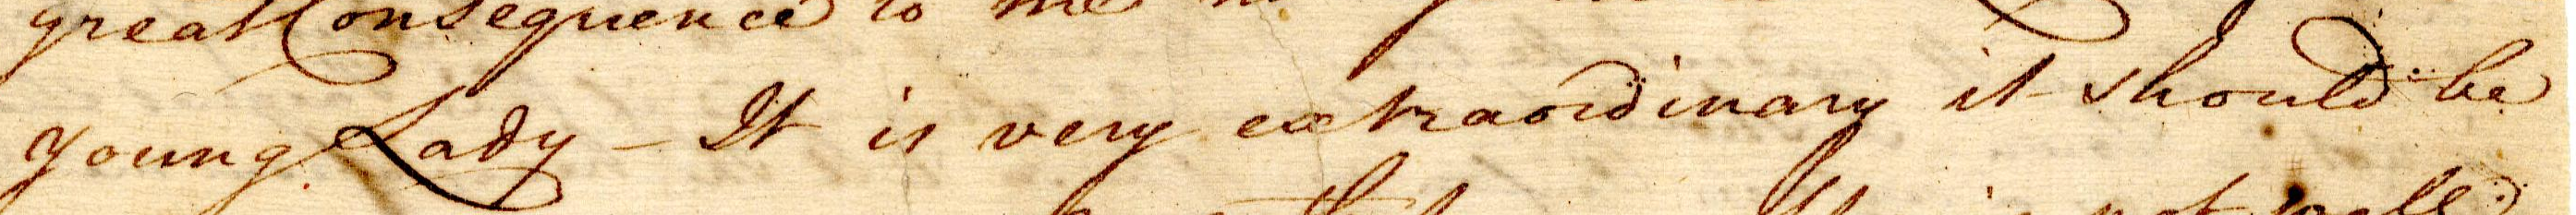young Lady- It is very extraordinary it should be
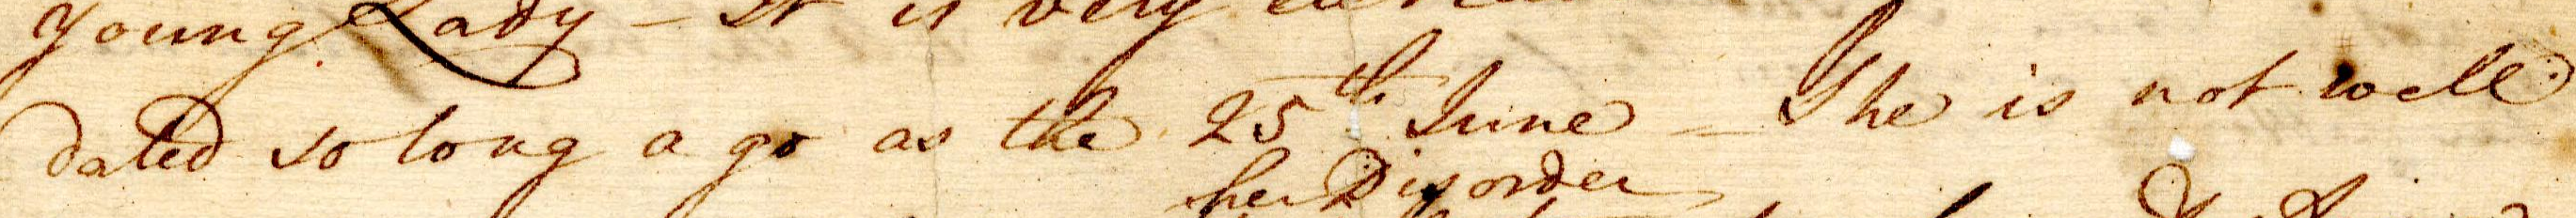dated so long a go as the 25^th June. She is not well
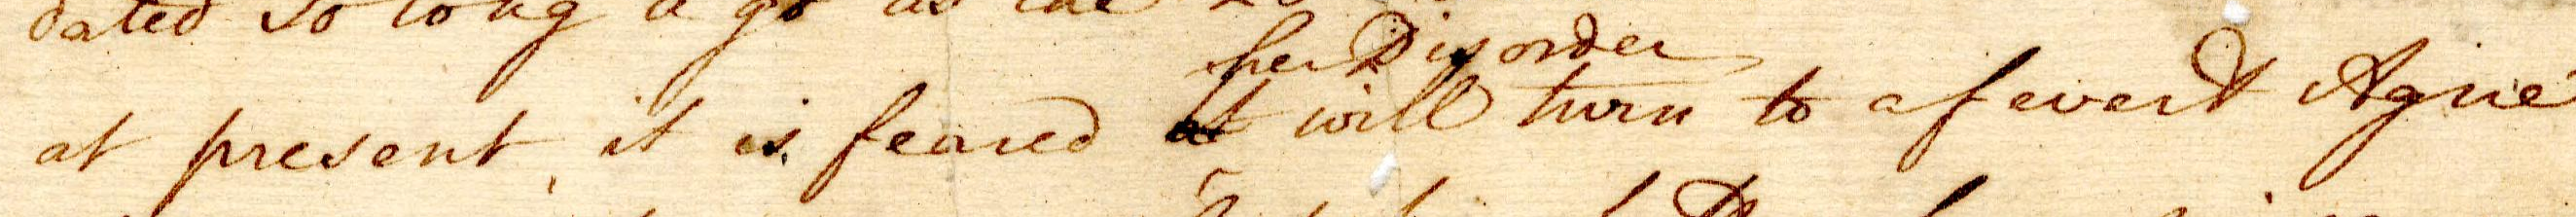at present it is feared it ^ will turn to a fever & Ague-
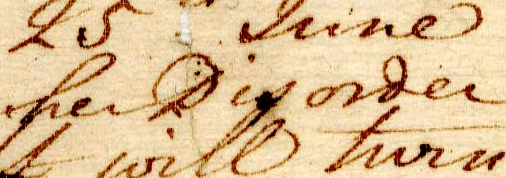her Disorder
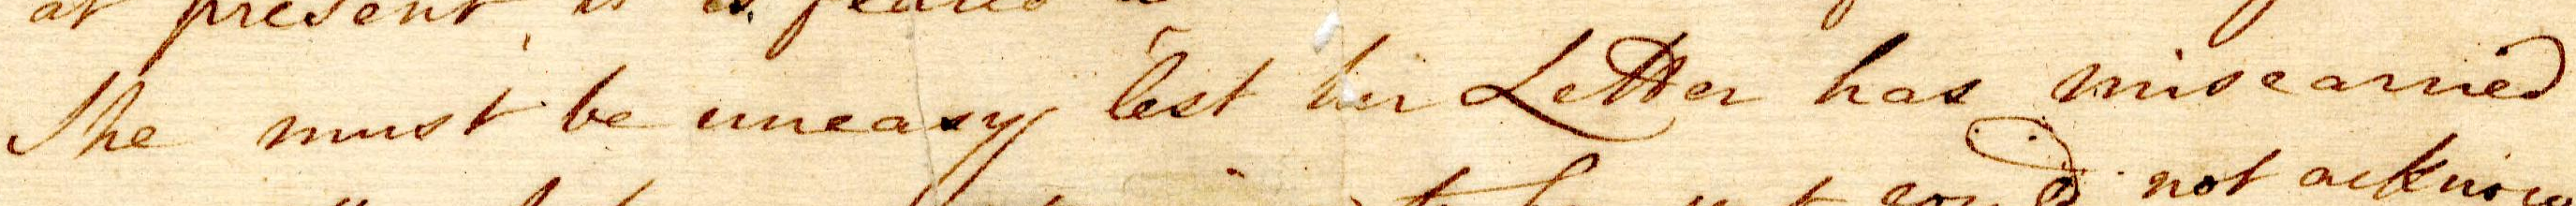She must be uneasy lest her Letter has miscarried
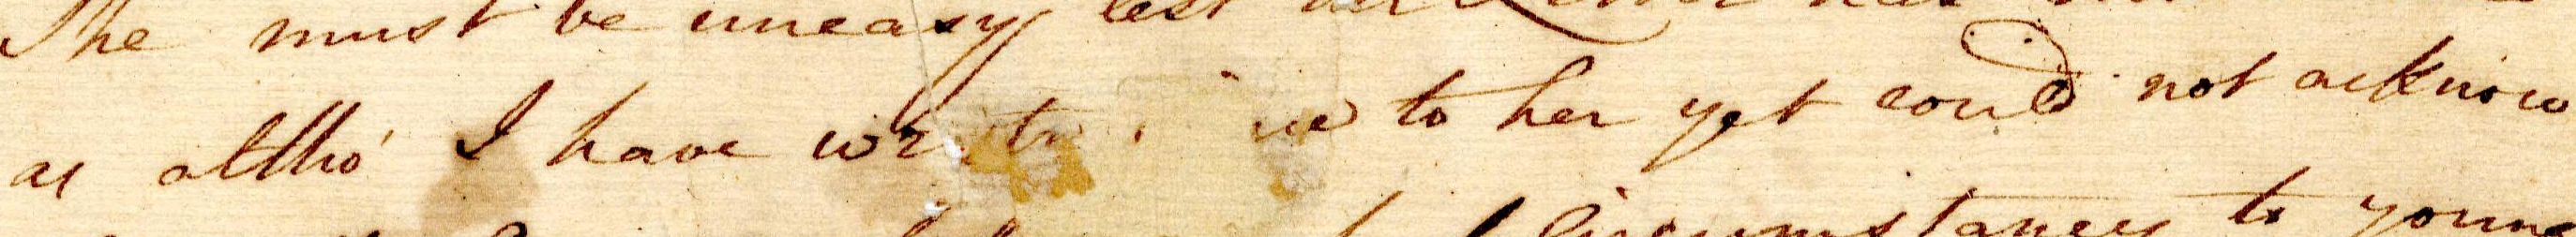as altho' I have written [___]e to her yet cou'd not acknow
